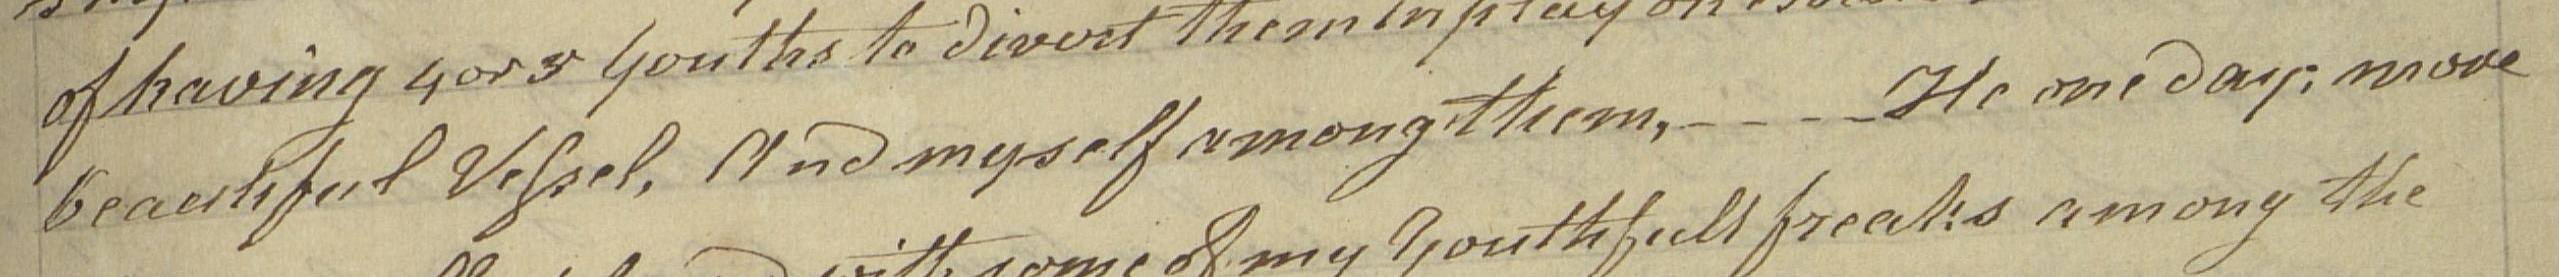beautiful Vessel. And myself among them, He one day: more
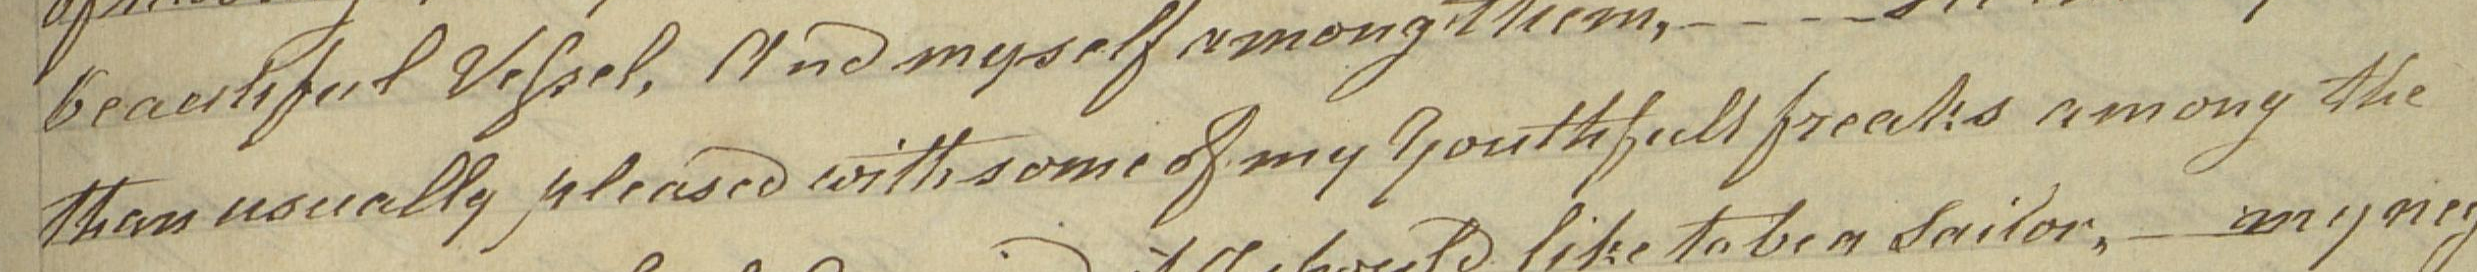than usually pleased with some of my Youthfull freaks among the
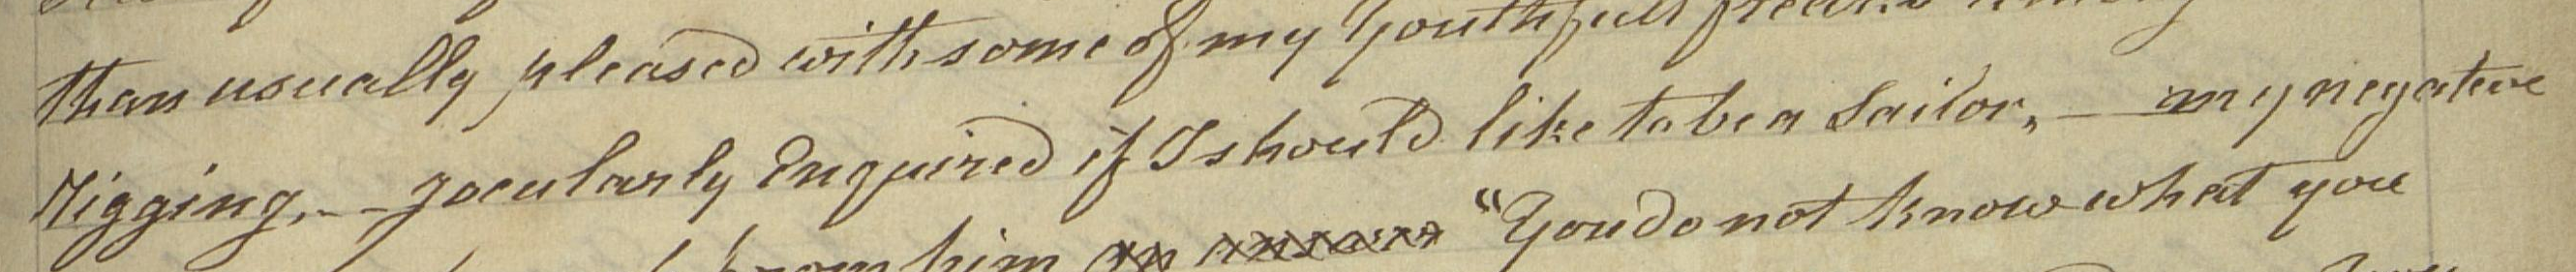rigging, Jocularly Enquired if I should like to be a Sailor, my negative
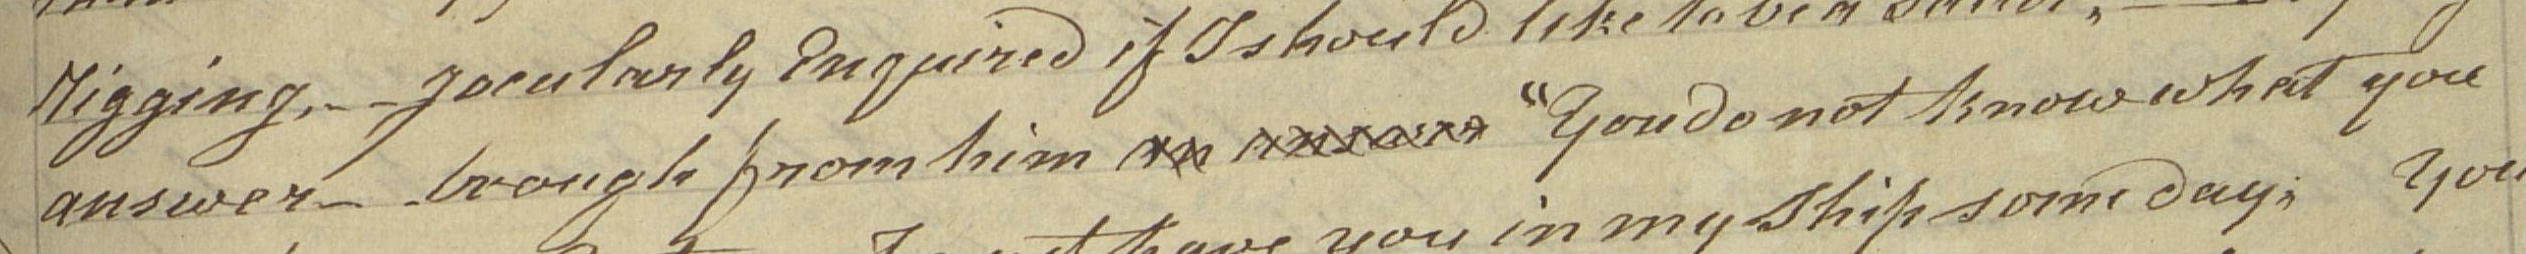answer brough from him [an answer] "You do not know what you
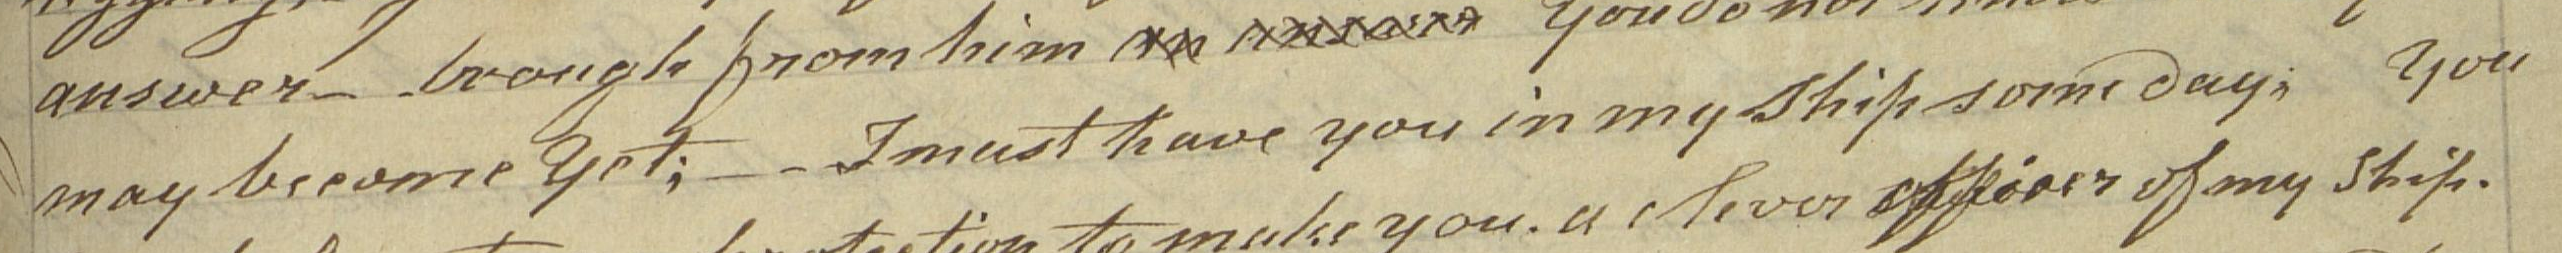may become Yet; I must have you in my Ship some day; You
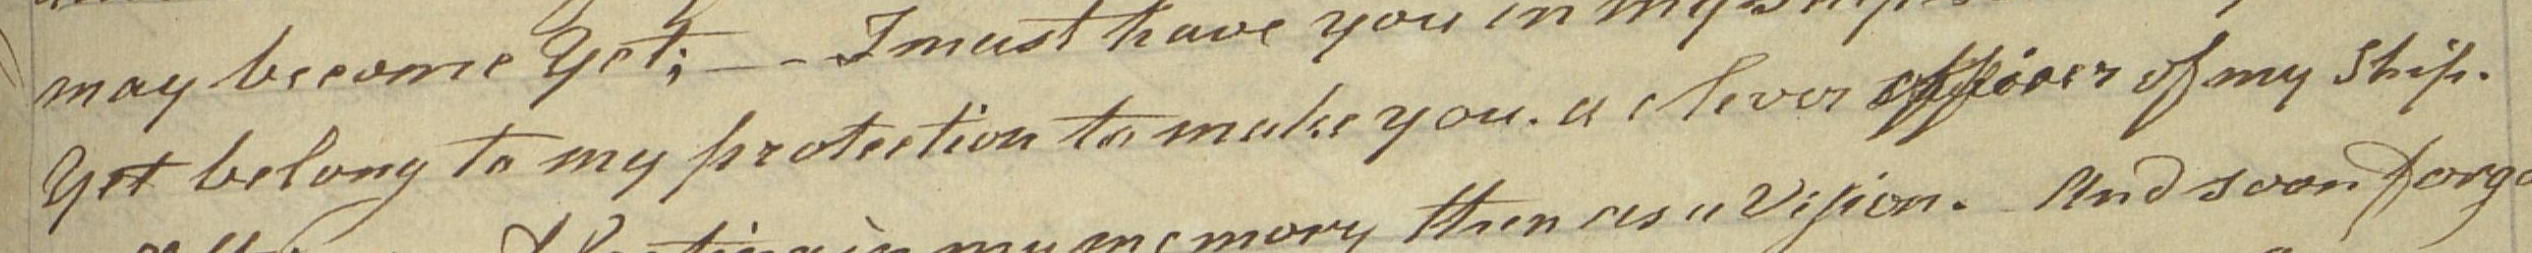yet belong to my protection to make you. a clever officer of my Ship.
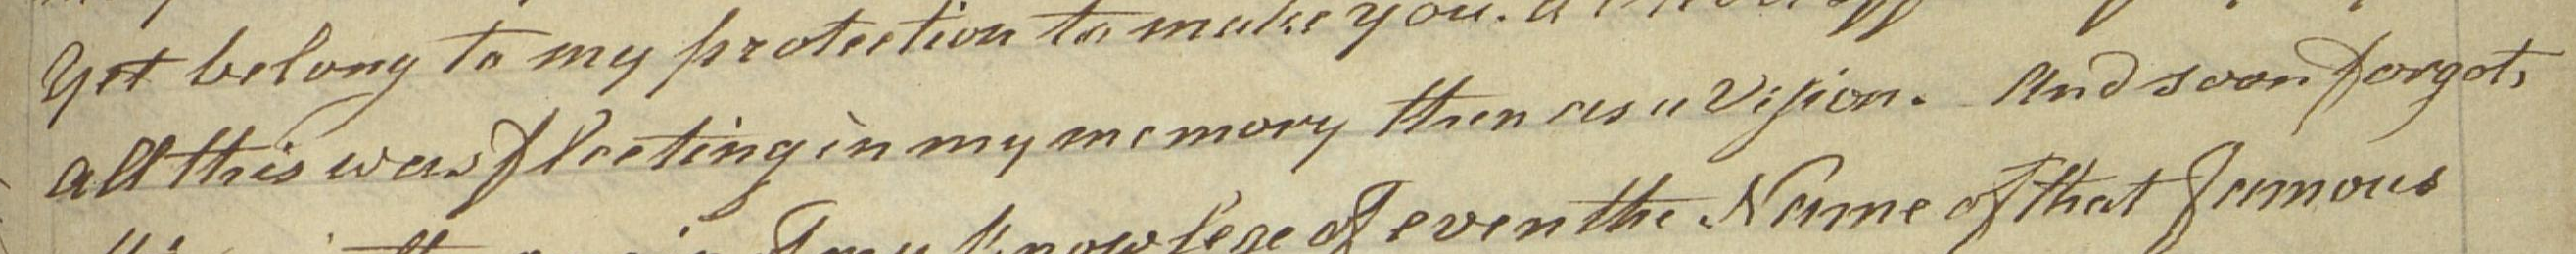alt this was fleeting in my memory then as a Vision. And soon forgot,
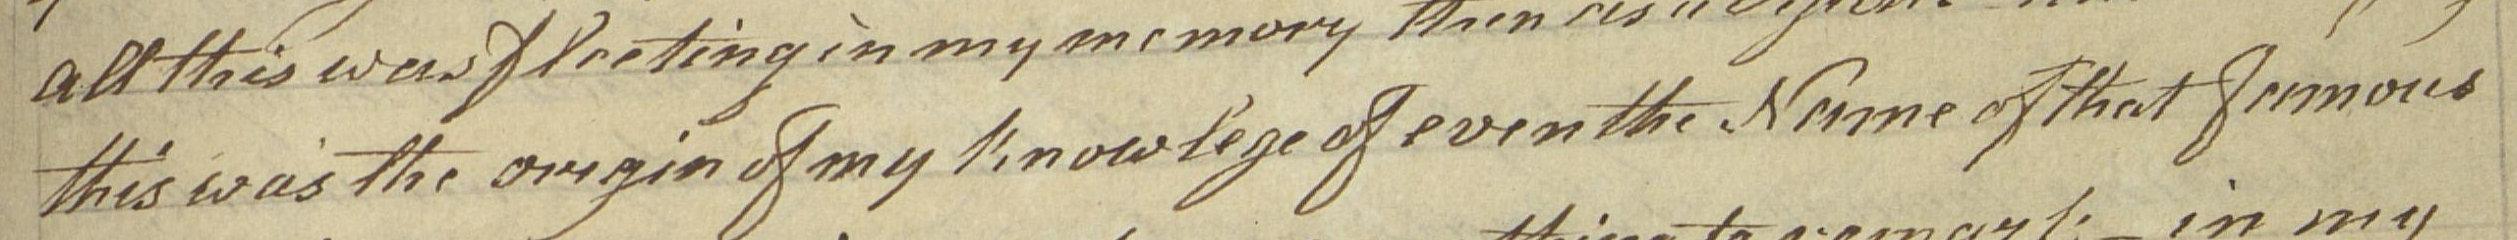this was the origin of my knowlege of even the Name of that famous
